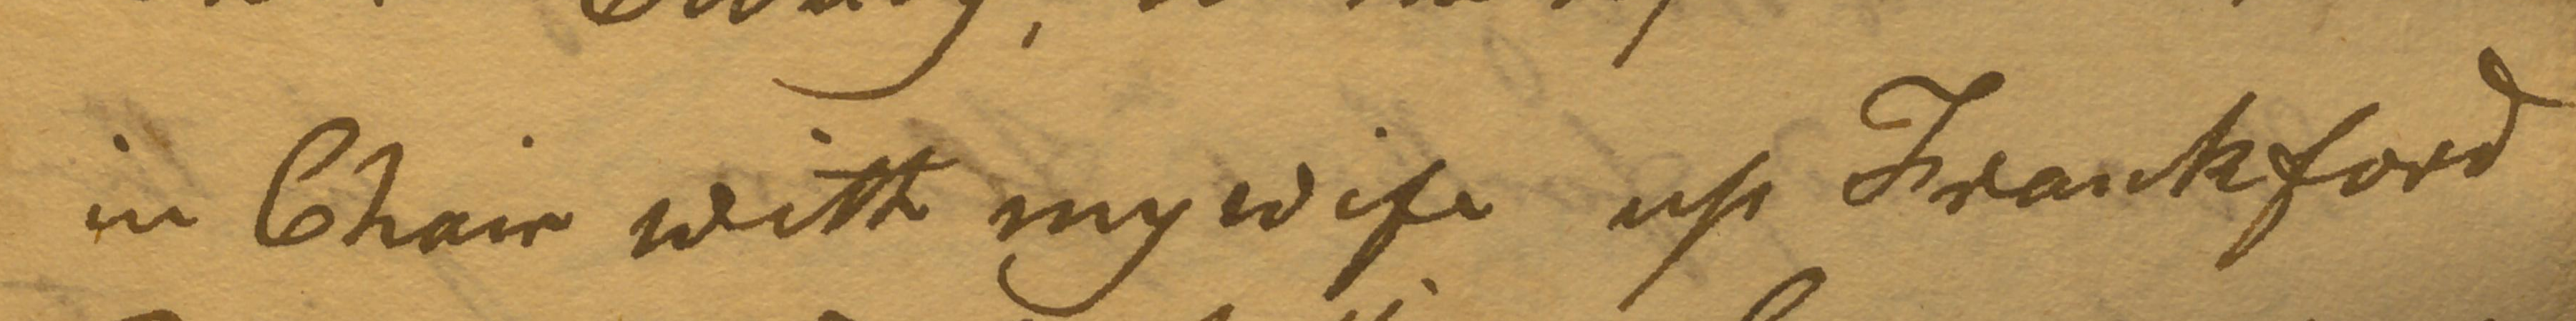in Chair with my wife up Frankford
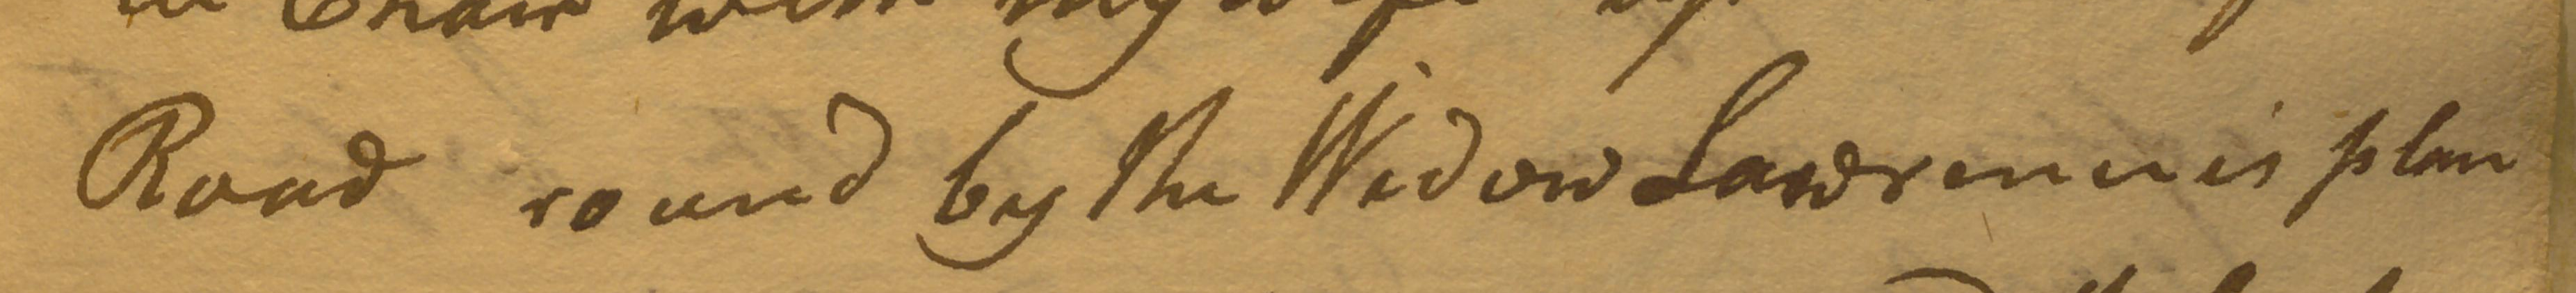Road round by the Widow Lawrence is plan
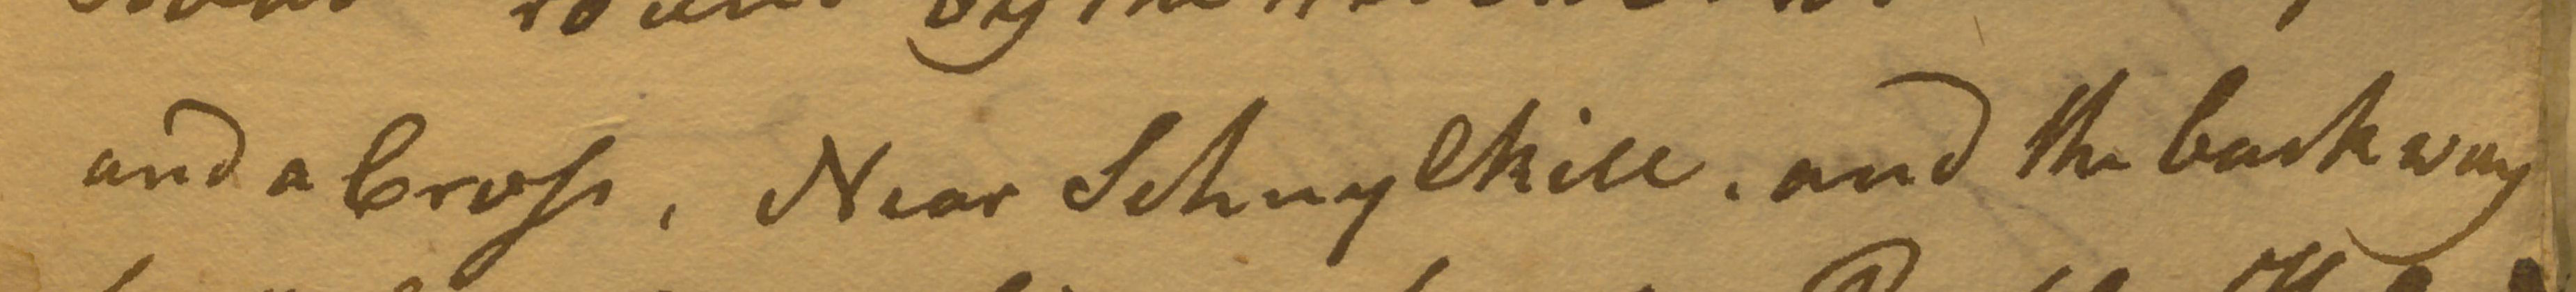and a Cross, Near Schuylkill, and the backway
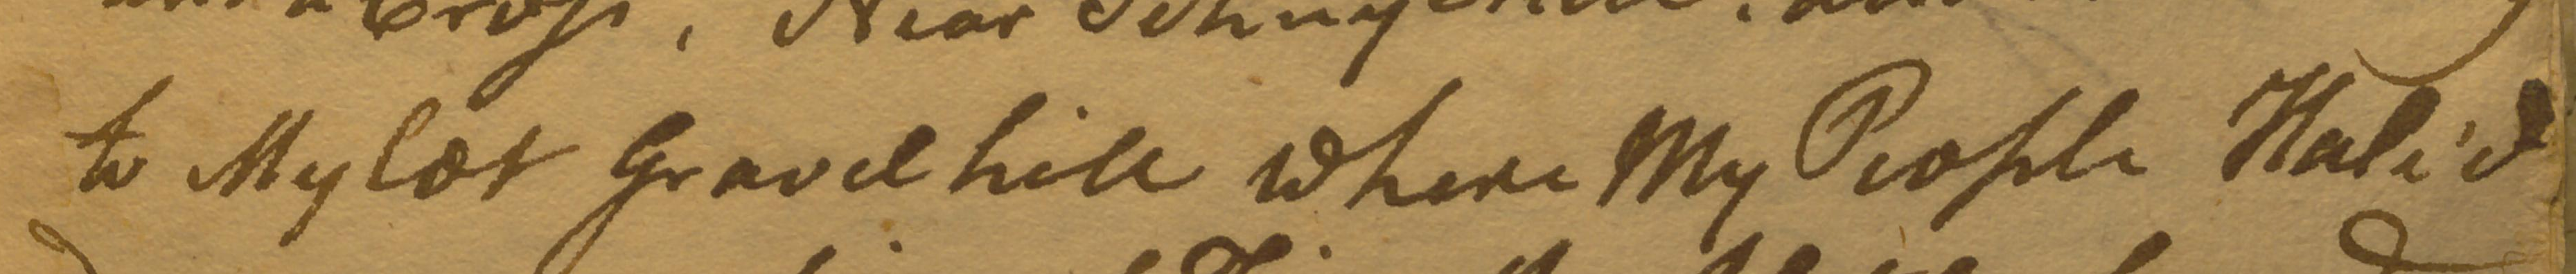to My lot Gravel hill where My People Hale'd
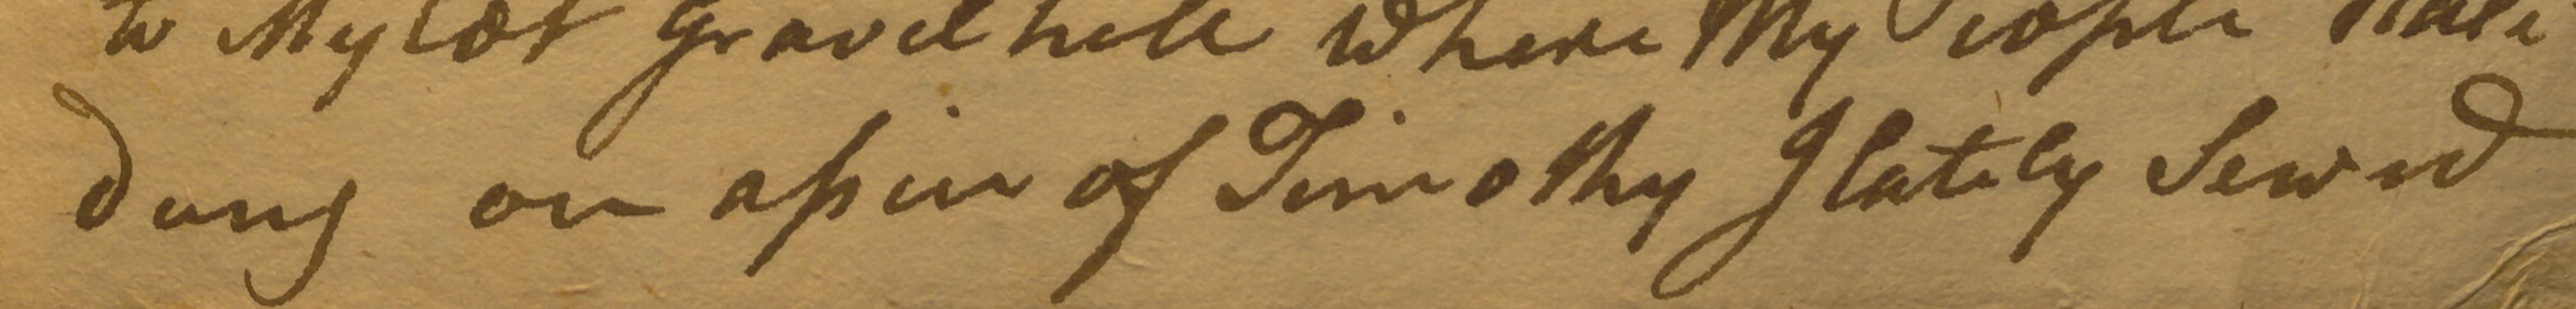dung on a pice of Timothy I lately sewed
